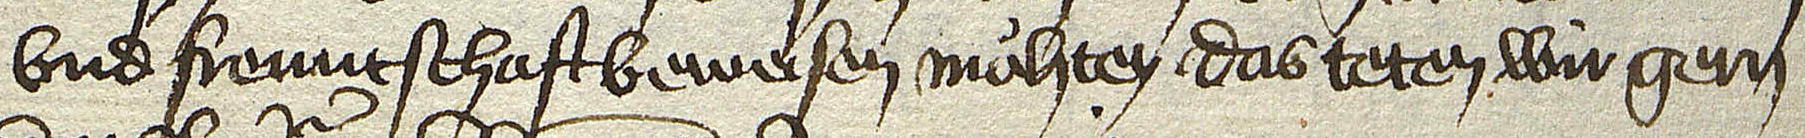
vnd freuntſchaft beweiſen möhten / das teten wir gern
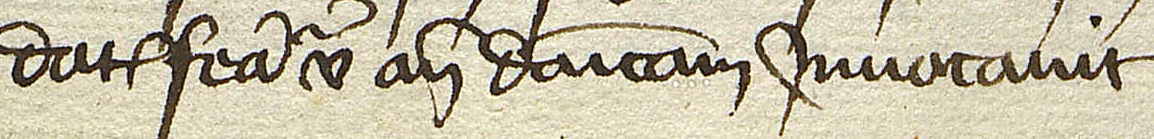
Dat* fe*a v* an* doicam* Inuocauit
